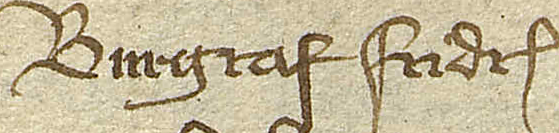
Burgraf fridr*
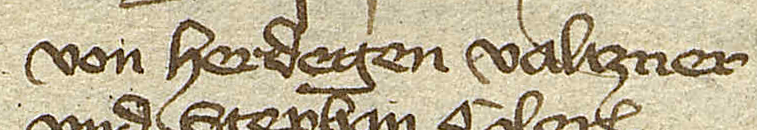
von herdegen valcʒner
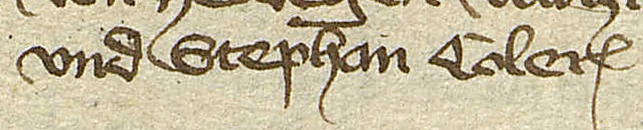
vnd Stephan Coler
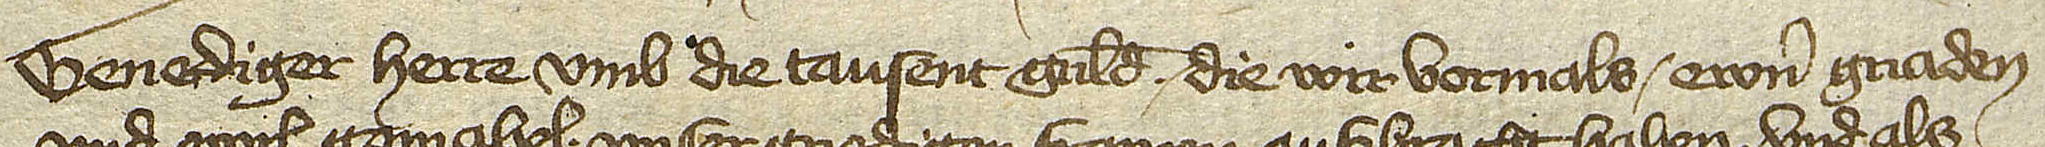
Gnediger herre vmb die tauſent guld* . / die wir vormals / ewn* gnaden
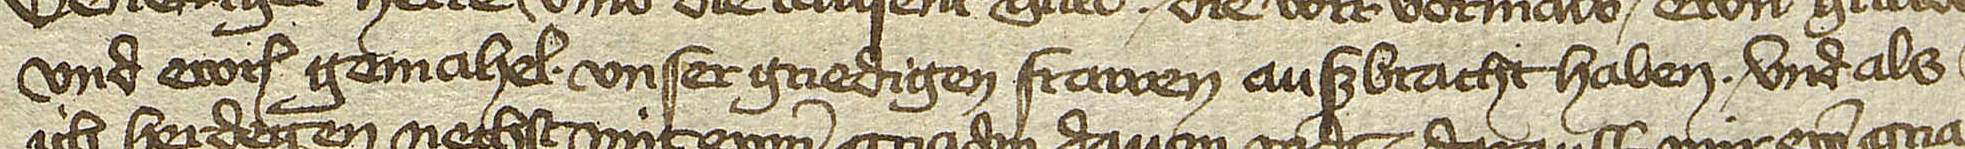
vnd ewr* gemahel . vnſer gnedigen frawen auſʒbracht haben . / vnd als
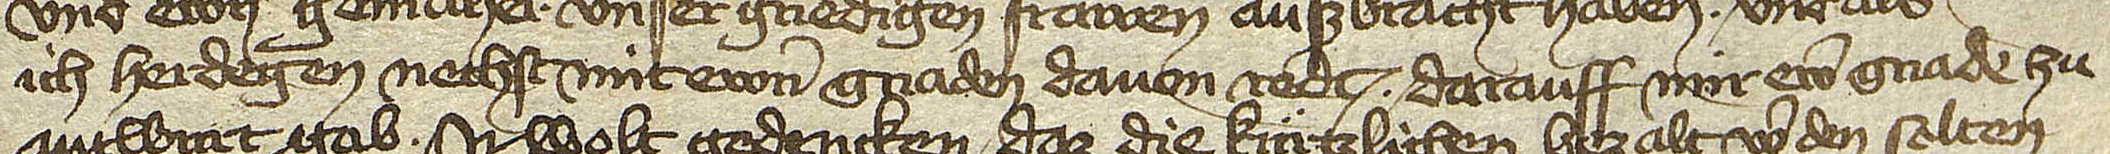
ich herdegen nechſt mit ewn* gnaden dauon redt / . darauff mir ew* gnade cʒu
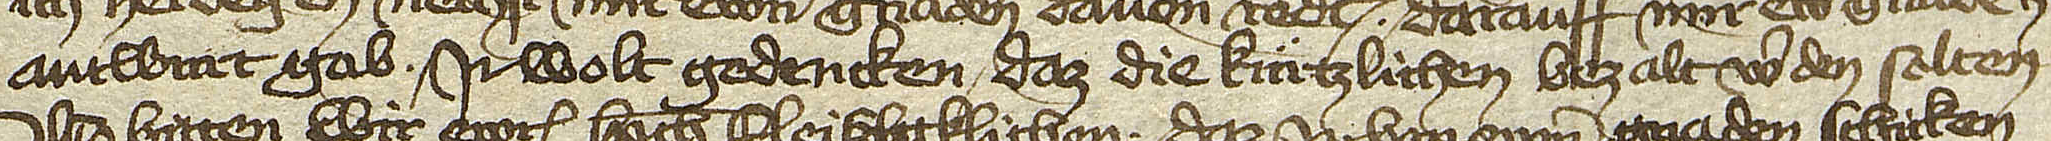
antwurt gab . / Ir wolt gedencken / daʒ die kürcʒlichen beʒalt w*den ſolten
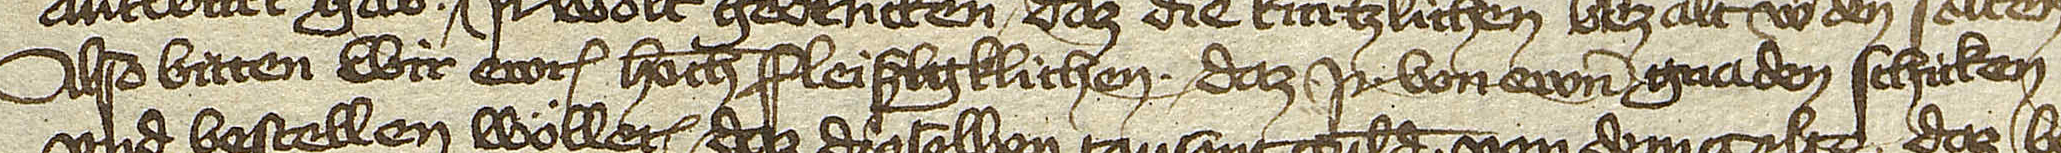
Alſo bitten wir ewr* hoch* fleiſʒigklichen / daʒ Ir von ewn* gnaden ſchicken
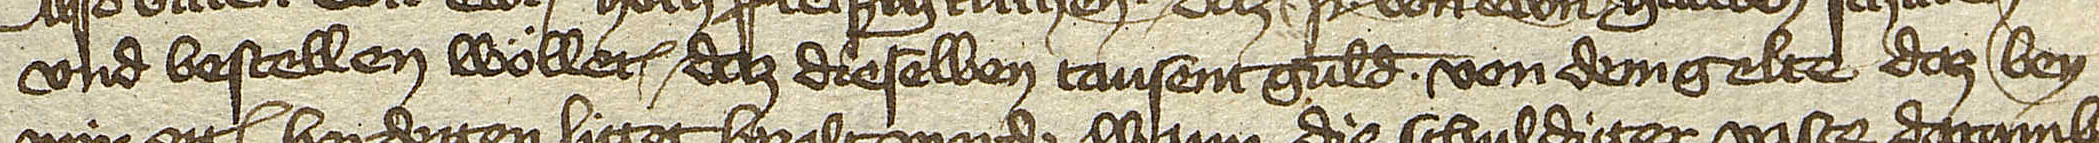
vnd beſtellen wöllet / daʒ dieſelben tauſent guld* von dem gelte daʒ bey
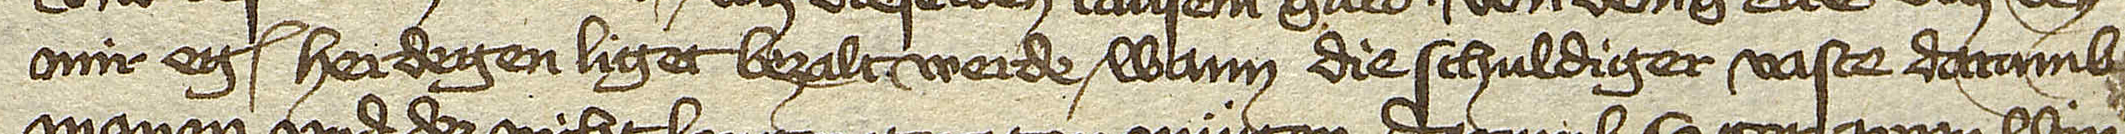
mir eg* herdegen liget beʒalt werde / wann die ſchuldiger vaſte darumb
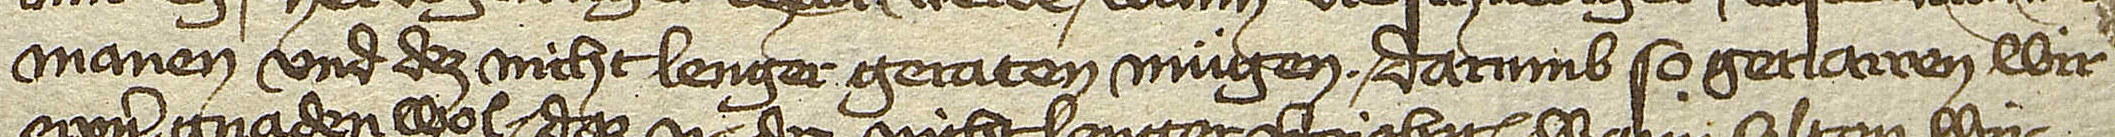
manen vnd deʒ nicht lenger geraten mügen . / darumb ſo getrawen wir
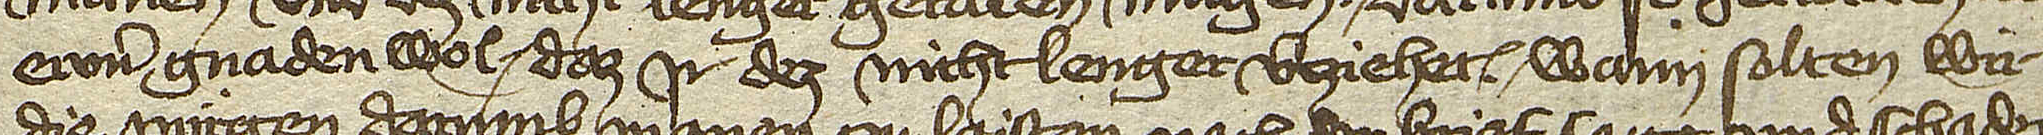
ewn* gnaden wol / daʒ Ir deʒ nicht lenger v*cʒiehet* . / wann ſolten wir
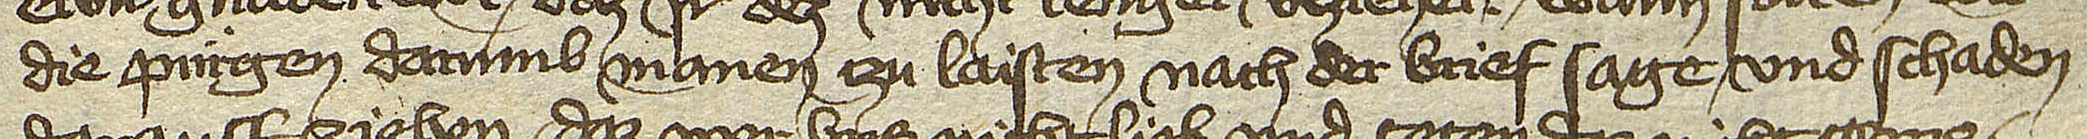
die pürgen darumb manen cʒu laiſten nach der brief ſage / vnd ſchaden
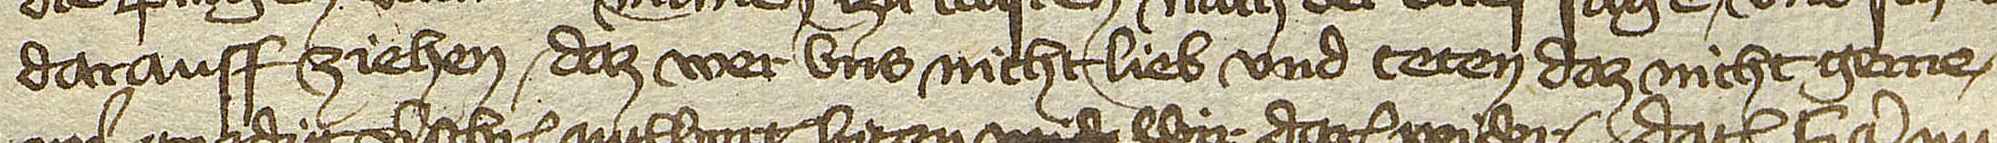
darauff cʒiehen / daʒ wer vns nicht lieb vnd tetem daʒ nicht gerne /
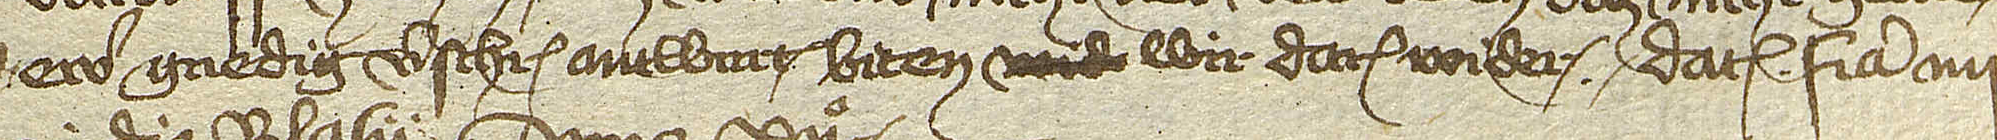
ew* gnedig v*ſchr* antwurt biten wid wir dar* wider / . dat* . fia* iiii
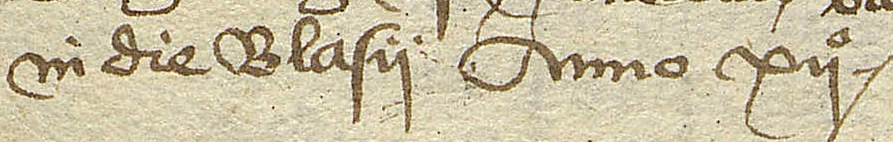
in die Blaſii Anno xii* - /
